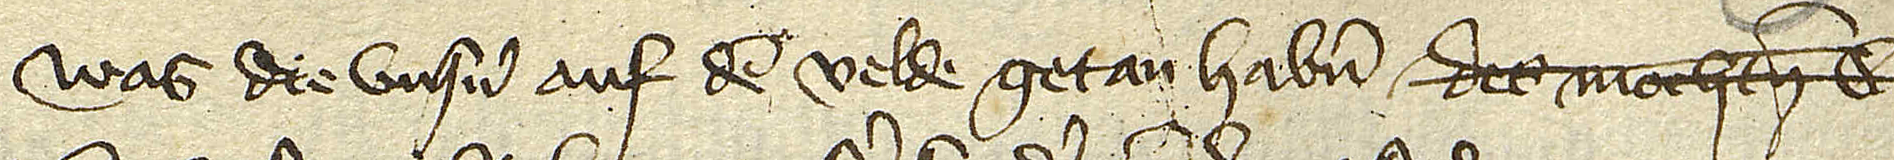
was die vnſn* auf d* velde getan habn* / des mochtn* w
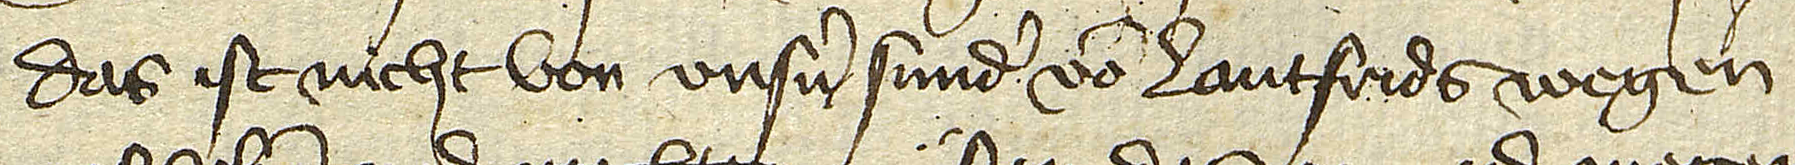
das iſt nicht von vnſn* ſund* vo* Lantfrids wegen
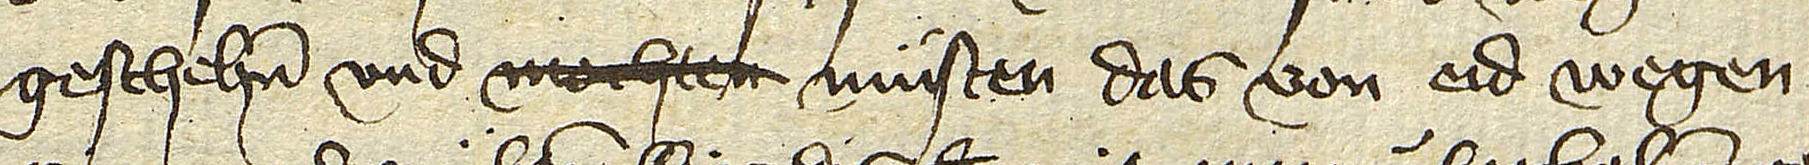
geſchehn* vnd mochten müſten das von eid wegen
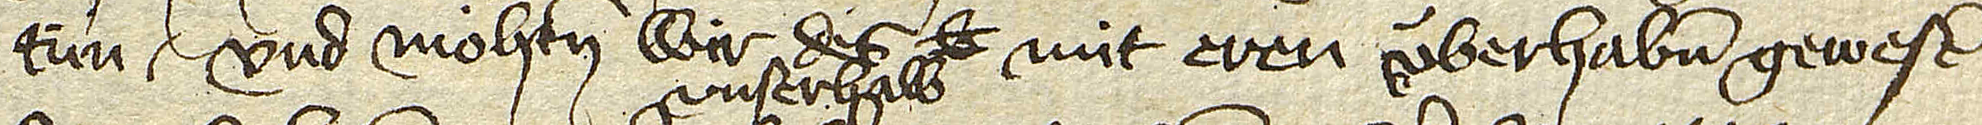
tün / vnd möhtn* wir des v mit eren v̈berhabn* geweſe*
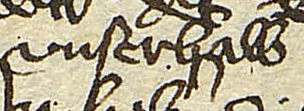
vnſerhalb
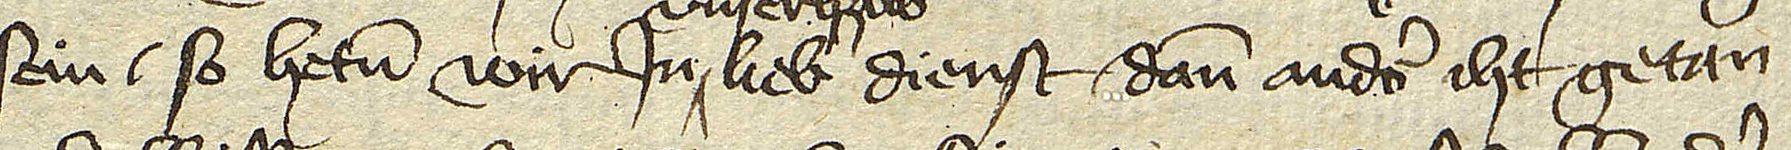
ſein / ſo hetn* wir In lieb* dienſt / dan* andn* iht getan
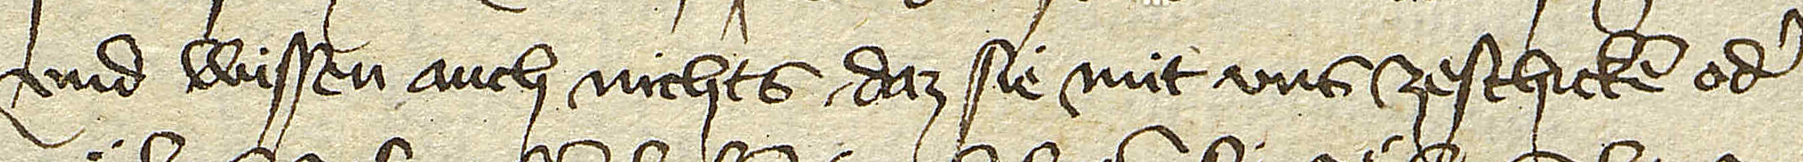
vnd wiſſen auch nichts / daʒ ſie mit vns cʒeſchicke* od*
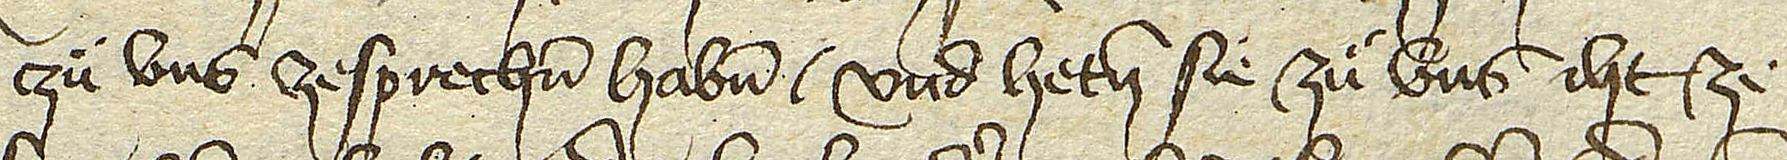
cʒü vns cʒeſprechn* habn* / vnd hetn* ſie cʒü vns iht cʒe
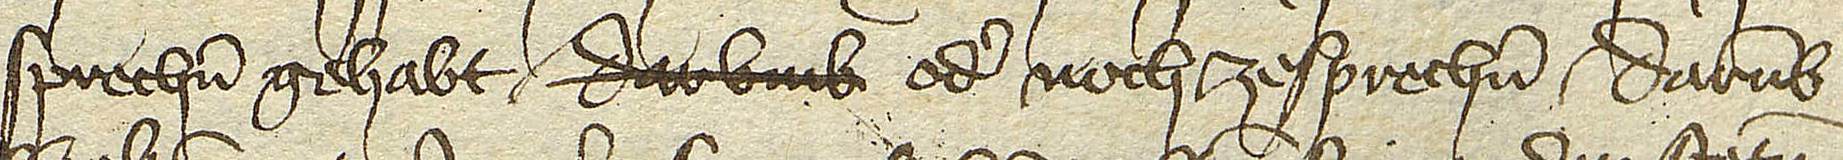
ſprechn* gehabt / darvmb od* noch cʒeſprechn* / darub*
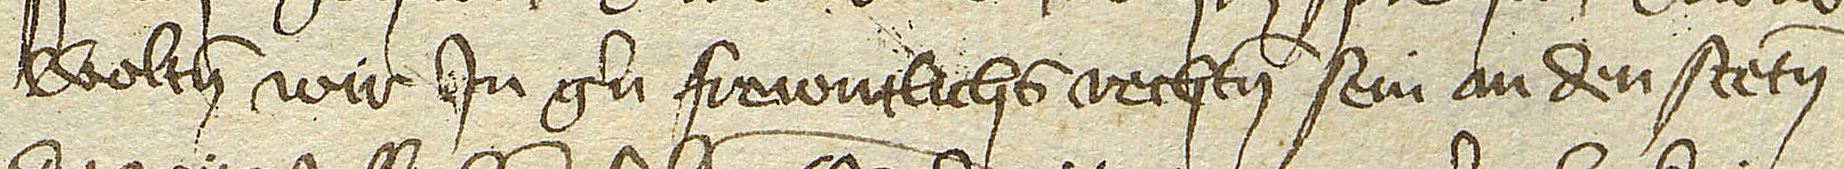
woltn* wir In g*n frewntlichs rechtn* ſein an den ſtetn*
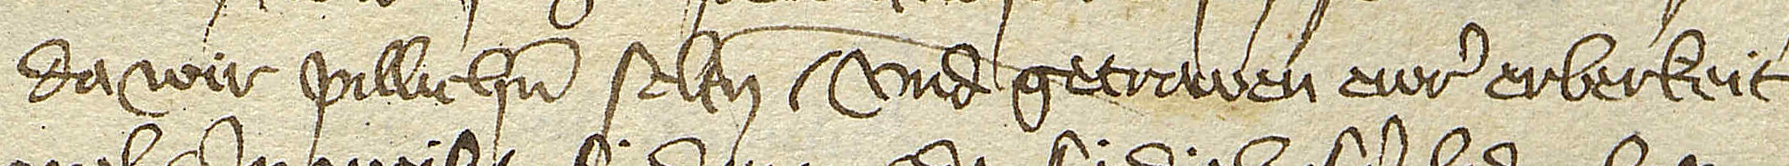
da wir pillichn* ſoltn* / vnd getrawen ewr* erberkeit
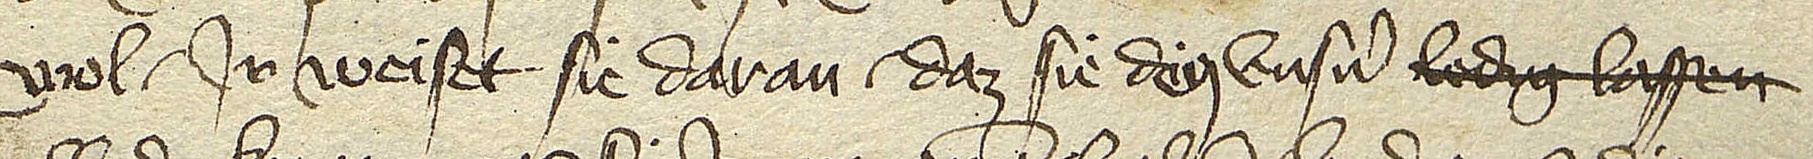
wol / Ir weiſet ſie daran / daʒ ſie den vnſn* ledig laſſen
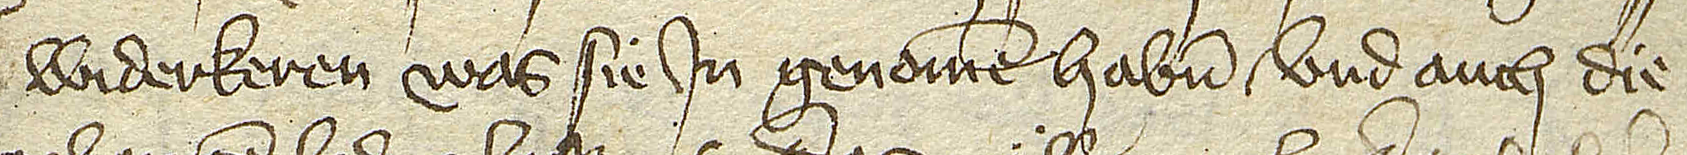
widerkeren was ſie In genome* habn* / vnd auch die
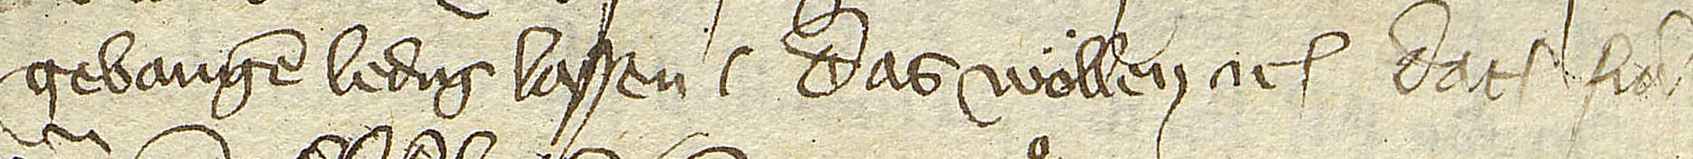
gevange* ledig laſſen / Das wöllen ec* dat* fia*
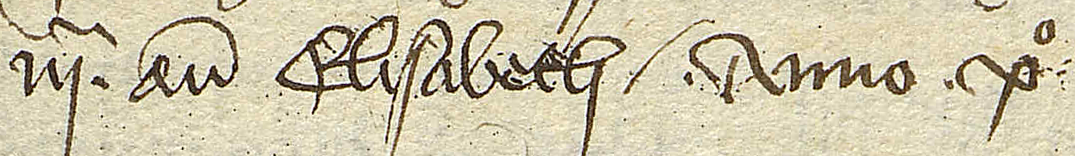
iii*. an* Eliſabeth / . Anno . x*
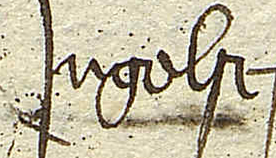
Ingolſt*
